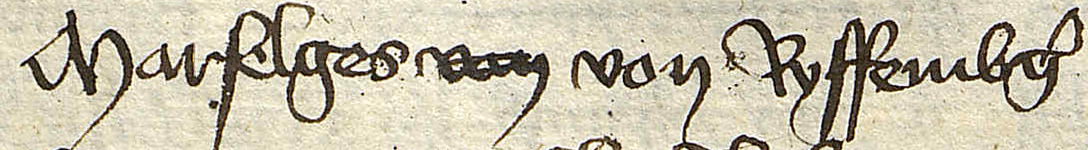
Marſelges von von Ryſſemb*g
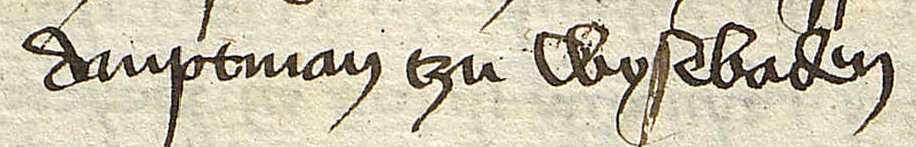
Amptman cʒu Wyſebaden
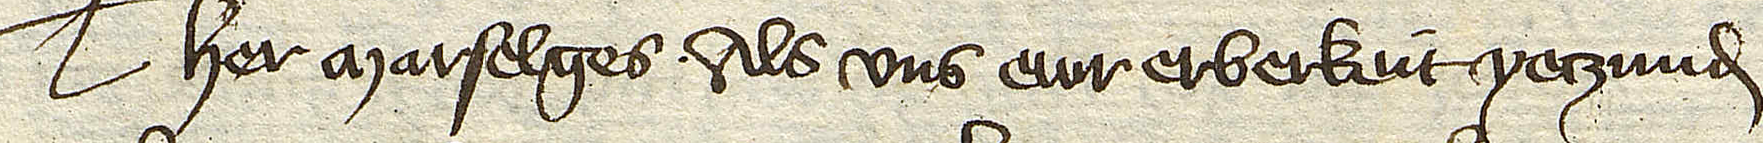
L* her Marſelges . Als vns ewr erberkeit yecʒund*
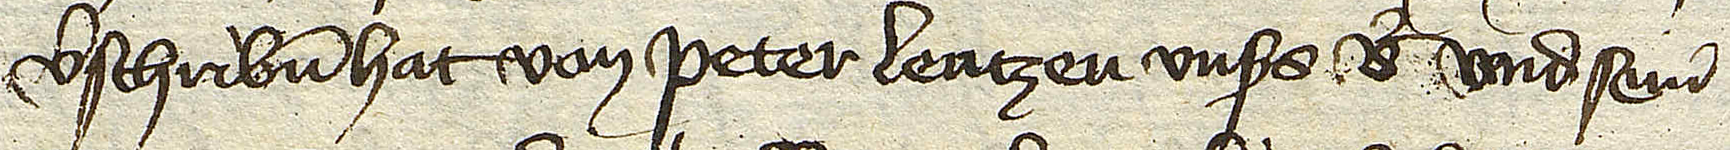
v*ſchrib*n hat von Peter leucʒen vnſ*s B* vnd ſein*
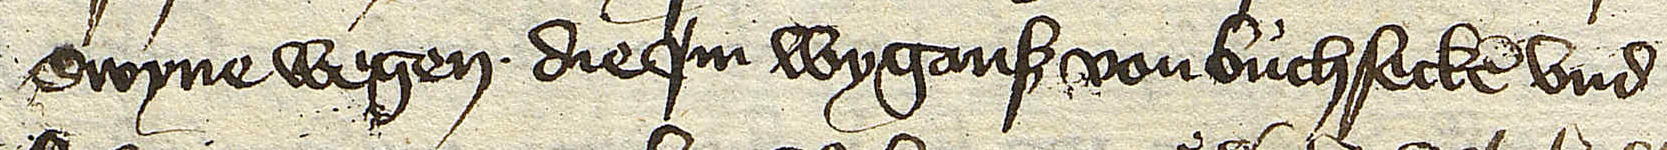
Swyne wegen . die Im Wyganſʒ von büchſecke* vnd
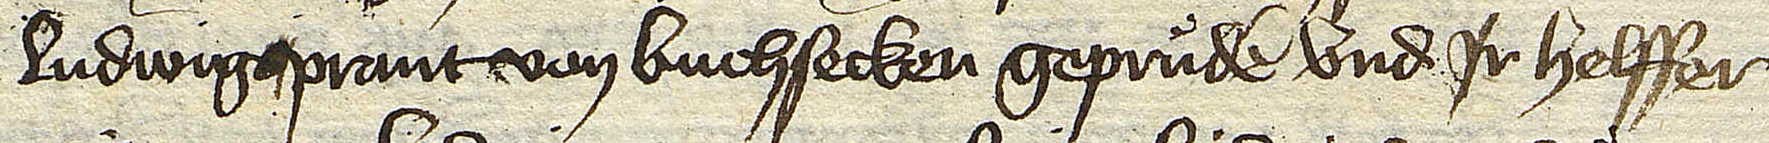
ludwig prant von buchſecken geprüde* vnd Ir helffer
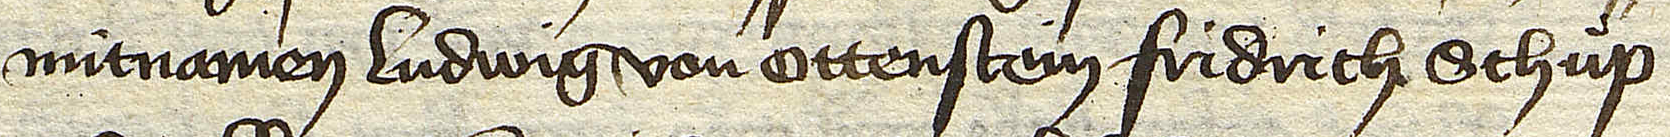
mitnamen ludwig von Ottenſtein fridrich Schüp
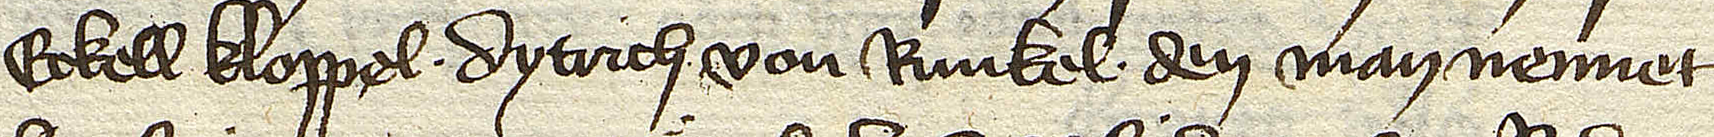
Eckell kloppel . Dyrich von Runkel . den man nennet
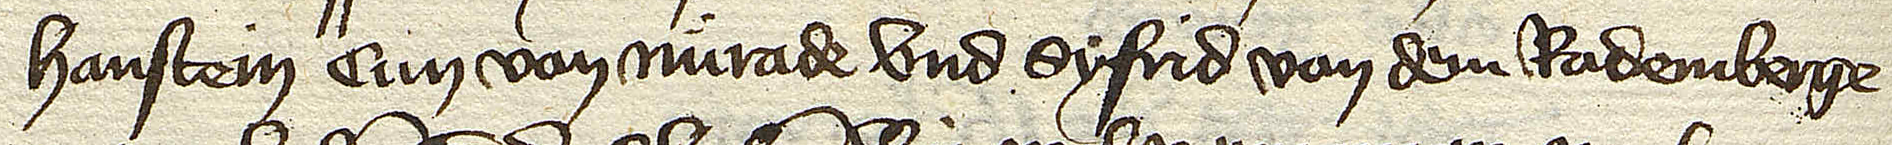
hanſtein Cun von Nürade vnd Syfrid von dem Rademberge
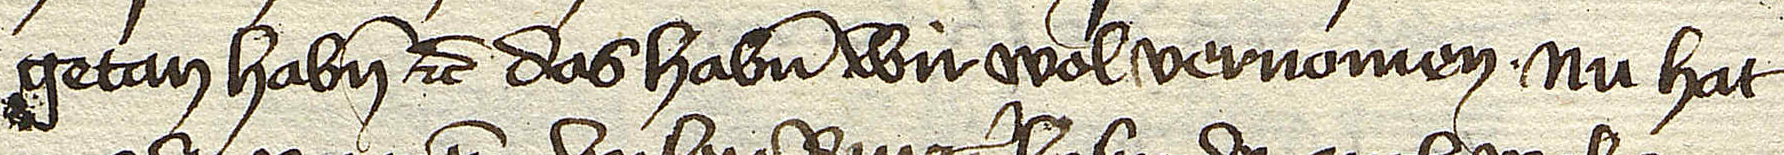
getan hab*n ec* . das hab*n wir wol vernomen . Nu hat
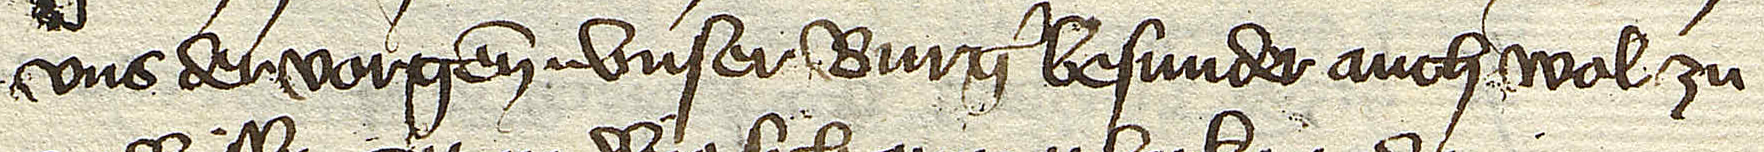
vns der vorgen* ~ vnſer Burg* beſunder auch wol cʒu
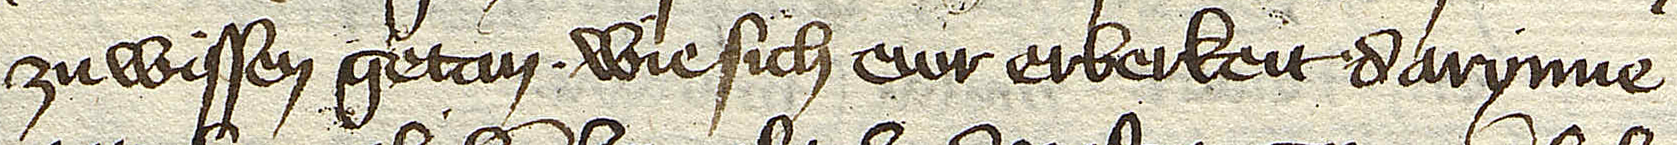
cʒu wiſſen getan . wie ſich ewr erberkeit darynne
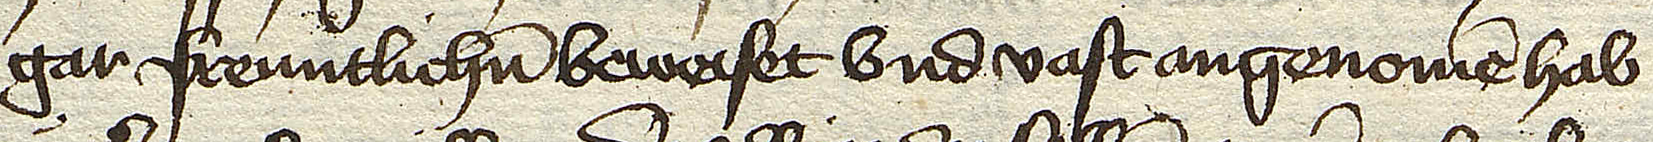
gar freuntlich*n beweiſet vnd vaſt angenome* hab
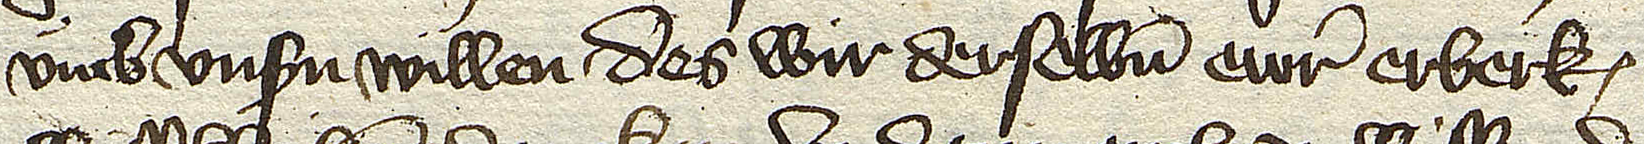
v̈mb vnſ*n willen / Des wir derſelb*n ew*r erberk*
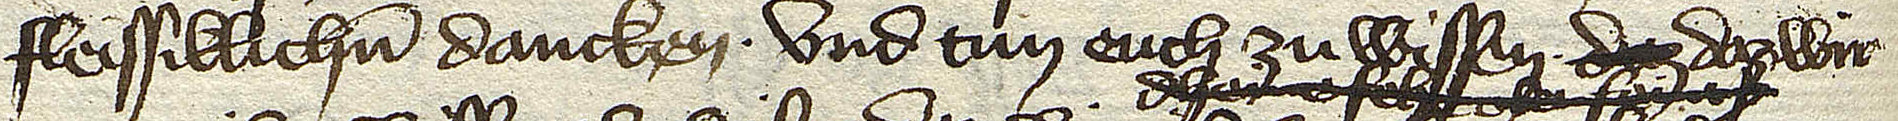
fleiſſiklich*n dancken . vnd tun euch ʒu wiſſen . daʒ daʒ wir
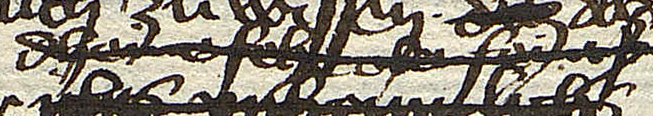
dheine fehe oder feintſ*
